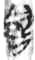檐（擔）
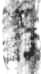○（巂）
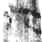六
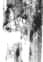敔
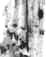之
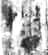檐（擔）
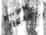二
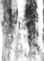檐（擔）
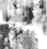方
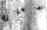一
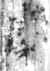麋
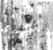五
